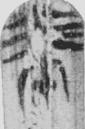○（幣）
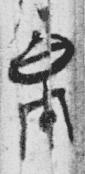帛
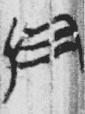於
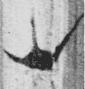山
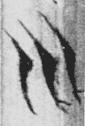川
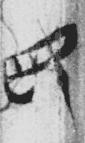母（無）
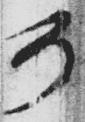乃
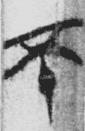不
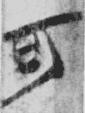可
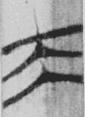夫
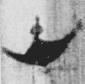山
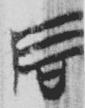石
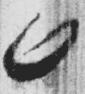㠯（以）
